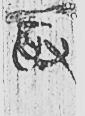取
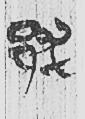邨
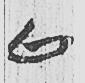㠯（以）
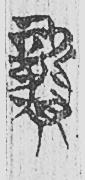贛
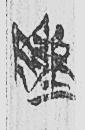陳
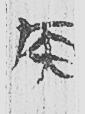侯
